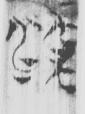流
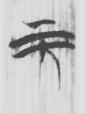而
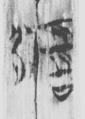{涇口}
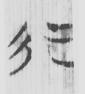行
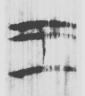王
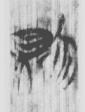則
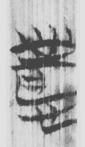{丵耳心}
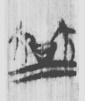替
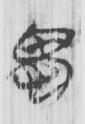{鬼心}
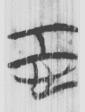{工心}
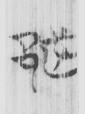{邑戉}
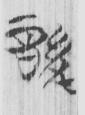{言山一王}
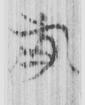{止舟}
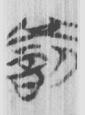罰
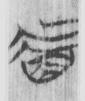{延𠀬}
